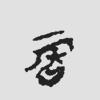丙
